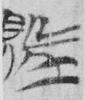○（望）
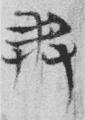奉
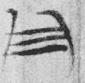丹
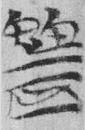箸（書）
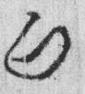㠯（以）
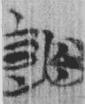朝
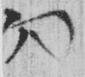大（太）
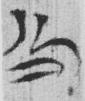公
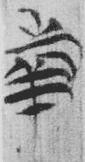南
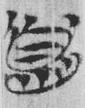面
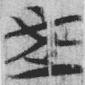武
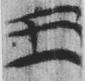王
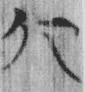北
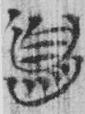面
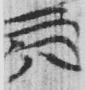而
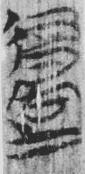復
